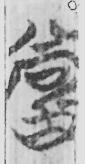嘗
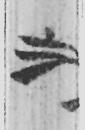之
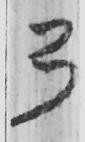乃
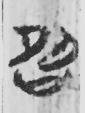卲
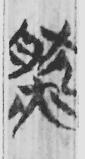然
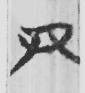四
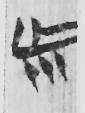巟
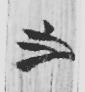之
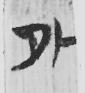外
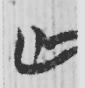亡
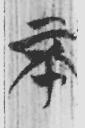不
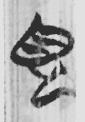見
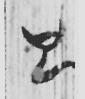也
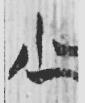少
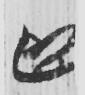臣
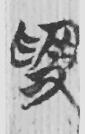受
